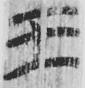王
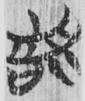若（諾）
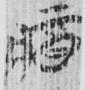𨟻（將）
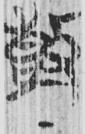鼓
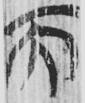而
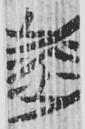涉
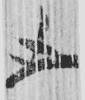之
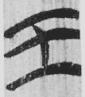王
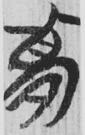夢
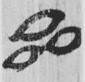厽（三）
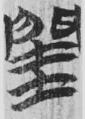閨
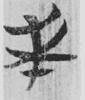未
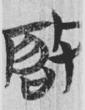啓
